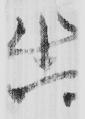生
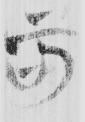可
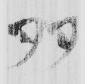多
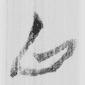㠯（以）
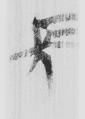長
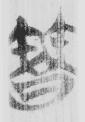{竹亯}
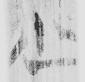少
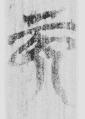而
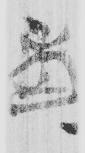老
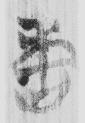{耂古}
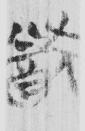猶
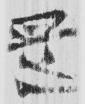是
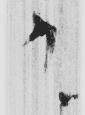人
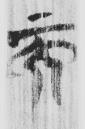而
